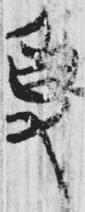事
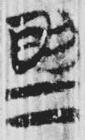則（則）
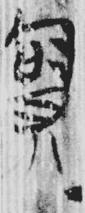○（貪）
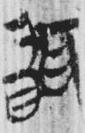○（聞）
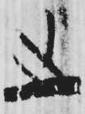之
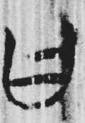曰
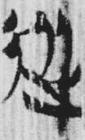從
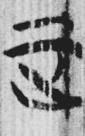正（政）
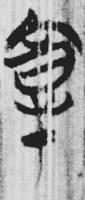○（敦）
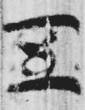五
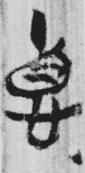惪（德）
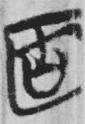固（固）
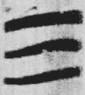三
